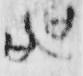申
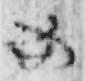右
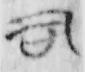司
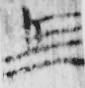馬
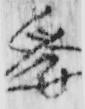愋
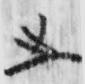之
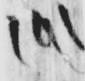州
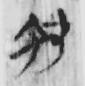加
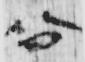公
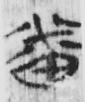番
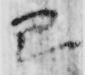己
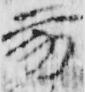亥
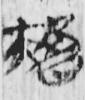○（胡）
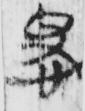快
